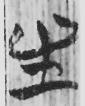生
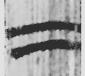二
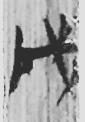戊
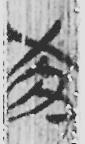豕
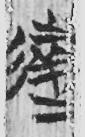{辶止㚔}（失）
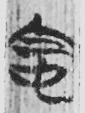{宀𠁩}（仲）
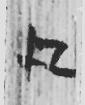卜
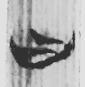曰
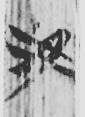我
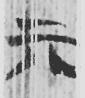亓
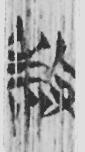殺
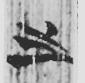之
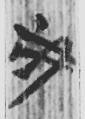我
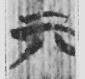亓
